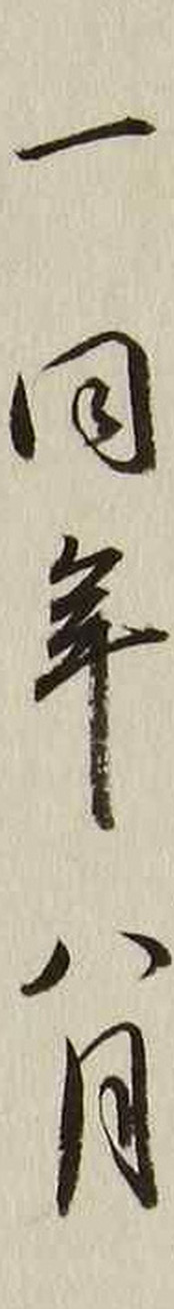一同年八月
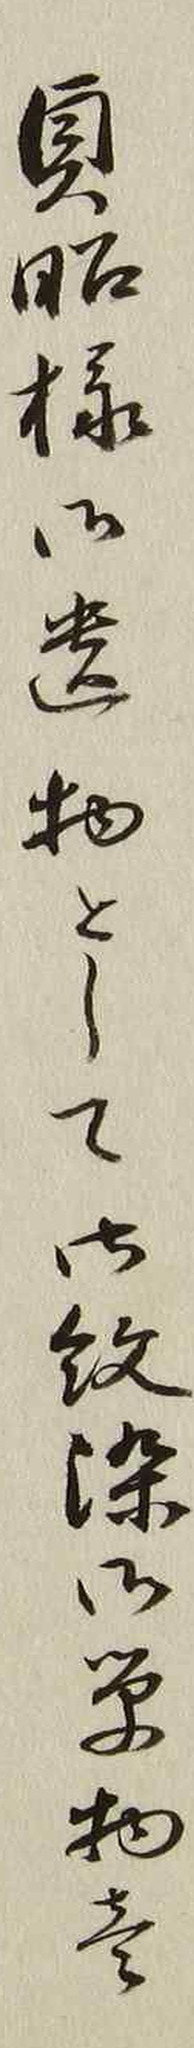貞昭様御遺物として御紋染御単物壱
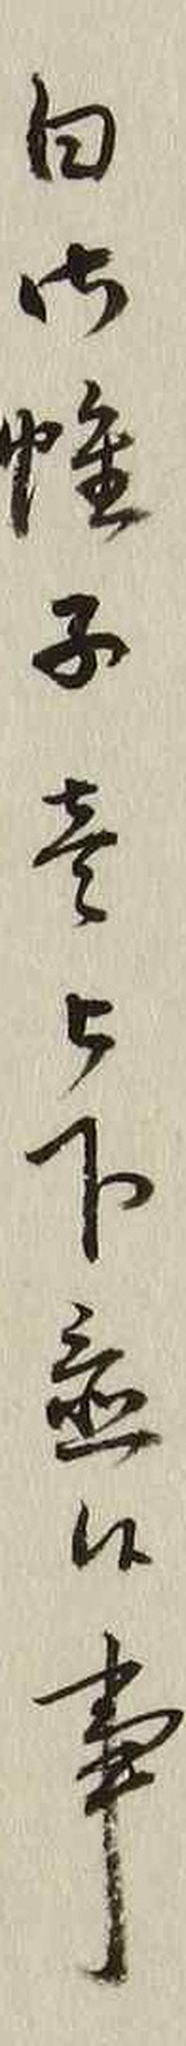白御帷子壱被下置候事
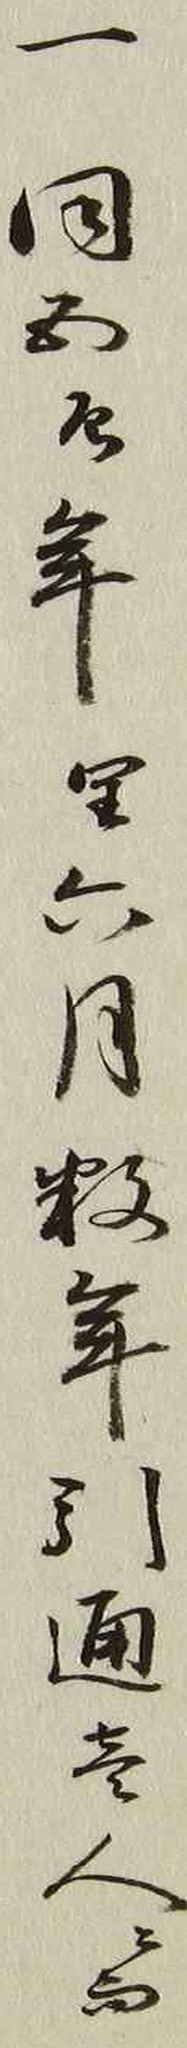一同五辰年閏六月数年引通壱人ニ而
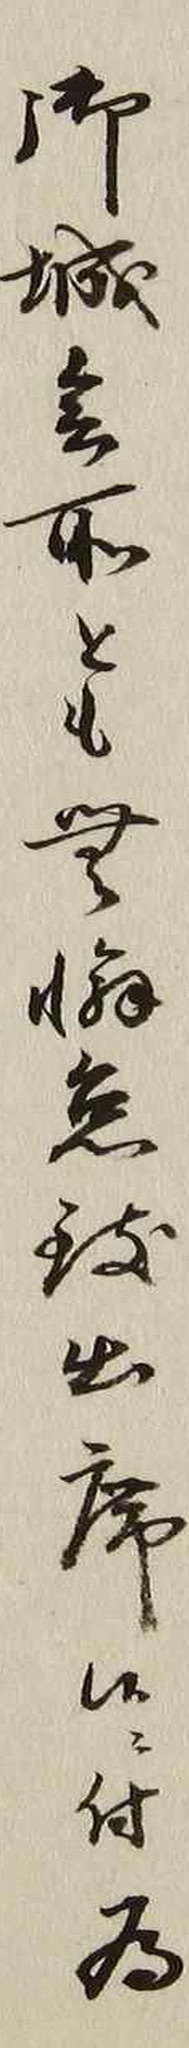御城会所とも無懈怠致出席候ニ付為
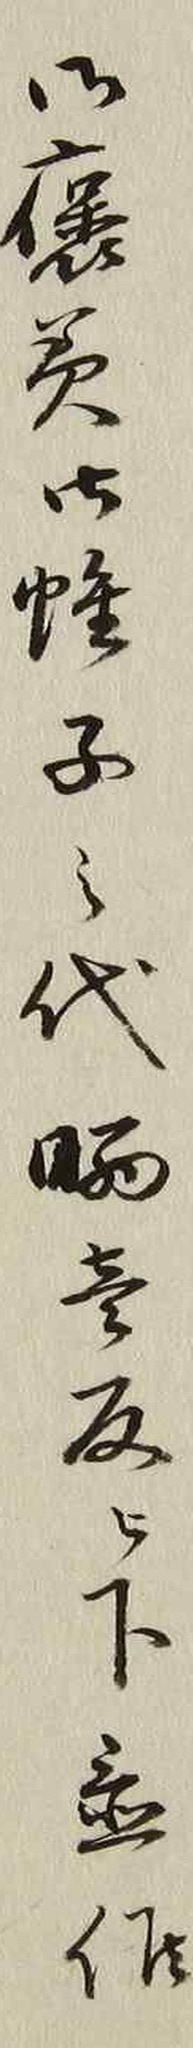御褒美御帷子之代晒壱反被下置候
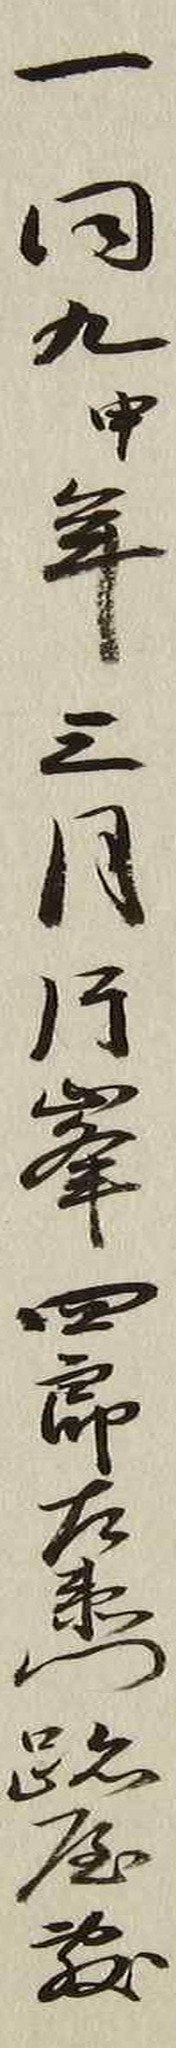一同九申年三月片峯四郎左衛門跡屋敷
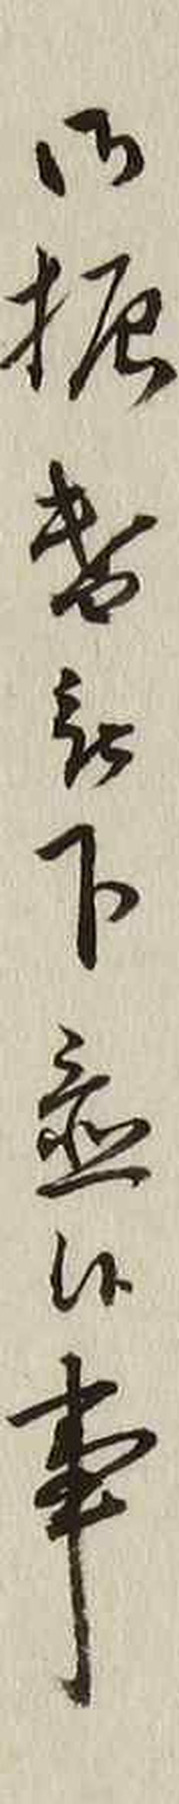御振替被下置候事
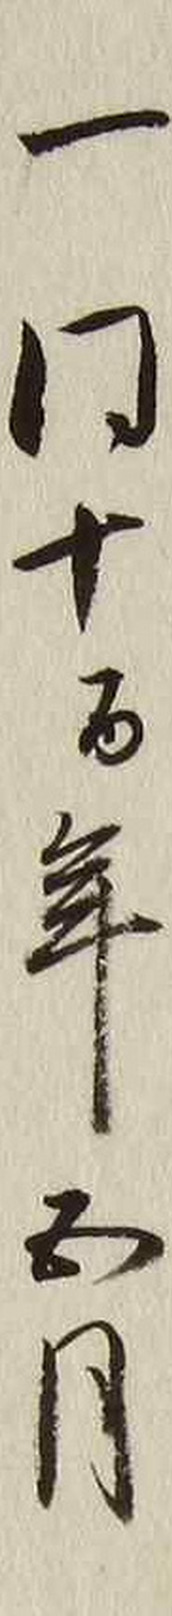一同十酉年五月
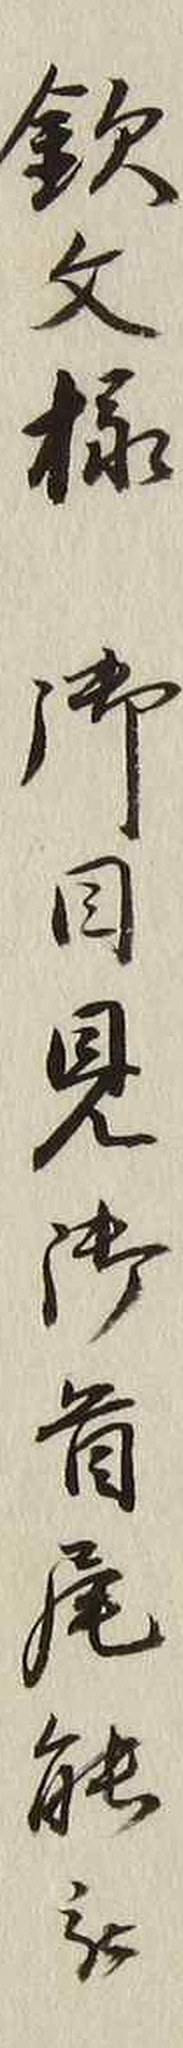欽文様御目見御首尾能被
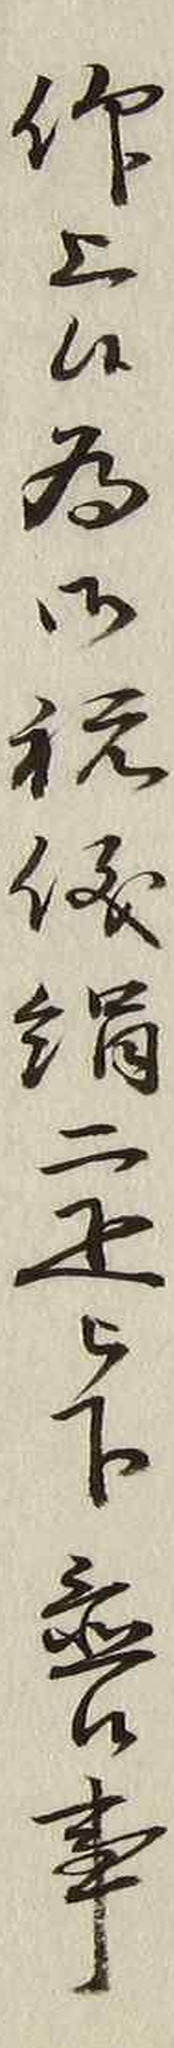仰上候為御祝儀絹二疋被下置候事
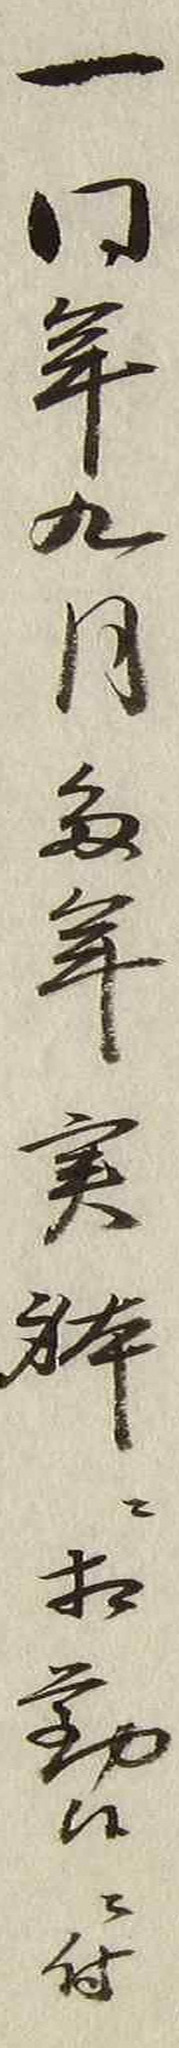一同年九月多年実体ニ相勤候ニ付
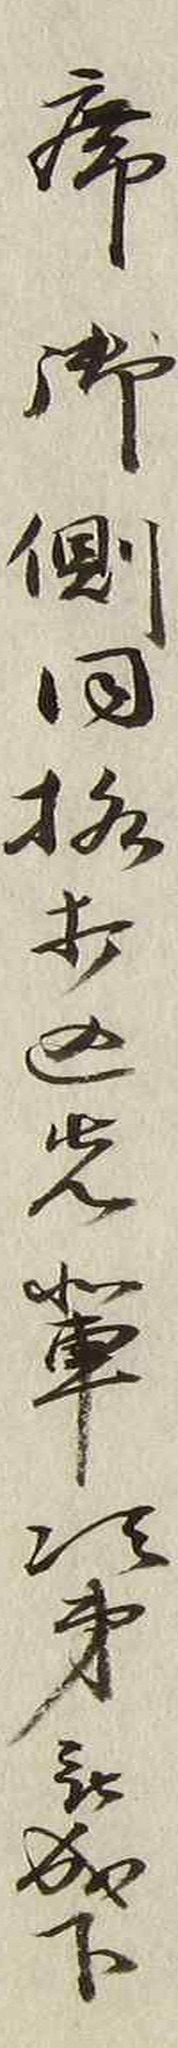席御側同格打込先輩次第被成下
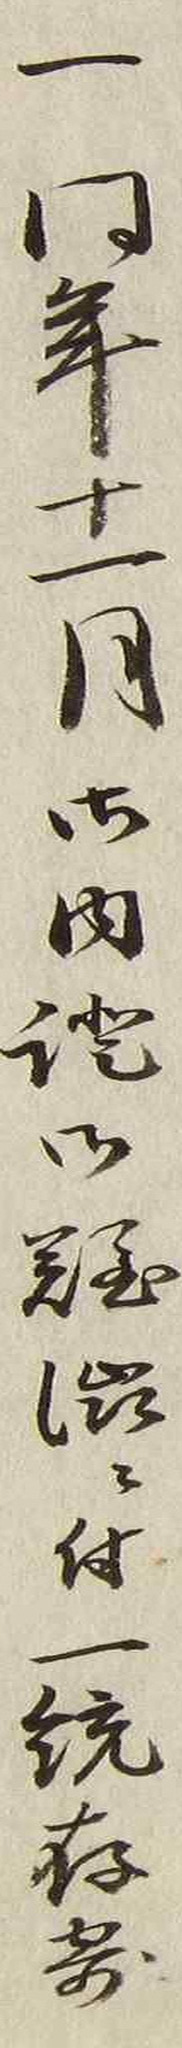一同年十一月御内証御難渋ニ付一統存寄

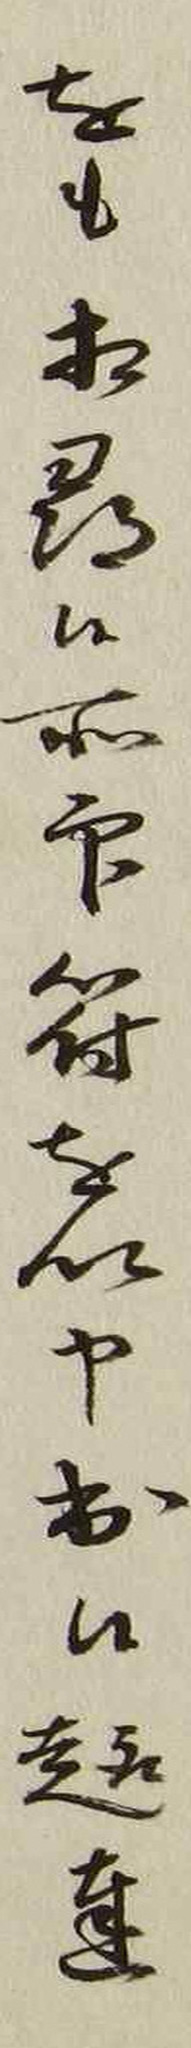をも相尋候所印符を以申出候趣達
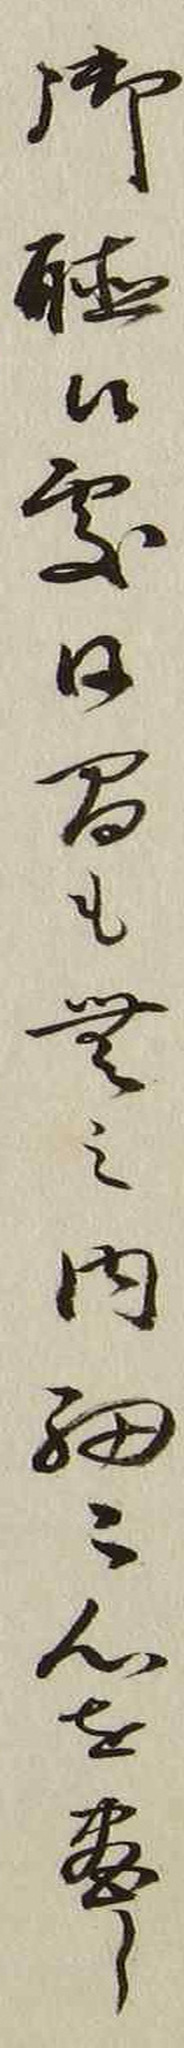御聴候処日間も無之内細々心を尽し
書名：諸士系譜　巻之160　な之部2
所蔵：会津若松市立会津図書館
